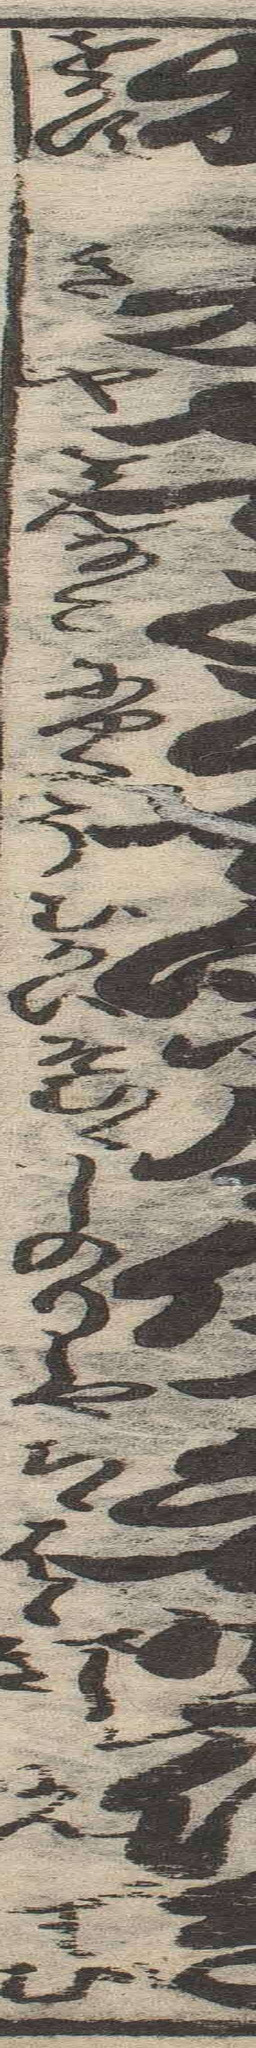をかすきやをんなこにやくうむかいそむくしのりしやちゝはゝへしきにんすゝむ
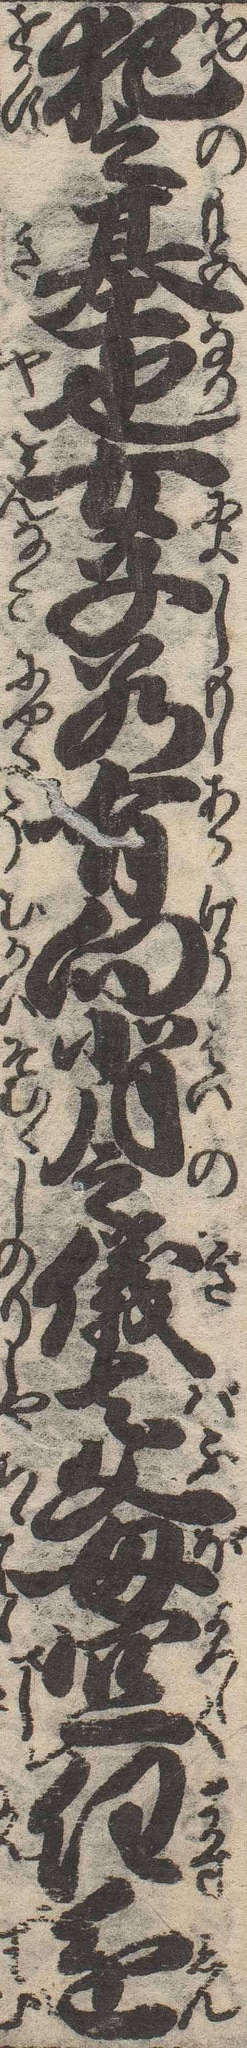犯之基也女子若有向背之儀者父母宜任進
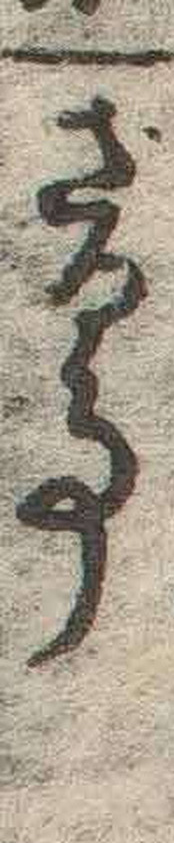さる事
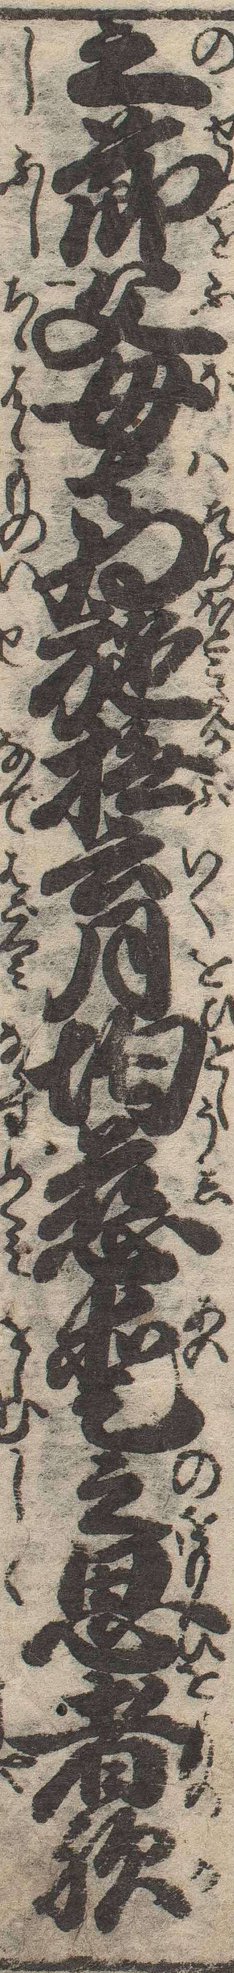之節父母者為施撫育均慈愛之恩者欤
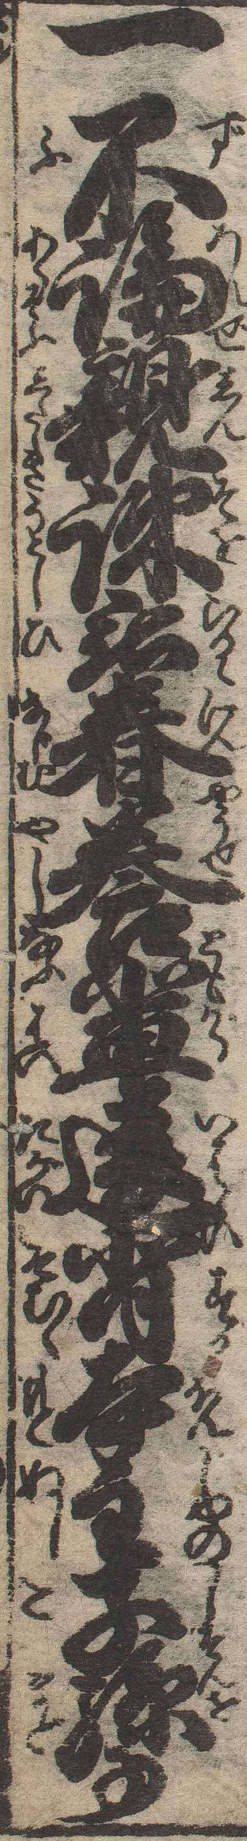一不論親疎被眷養輩違背本主子孫事

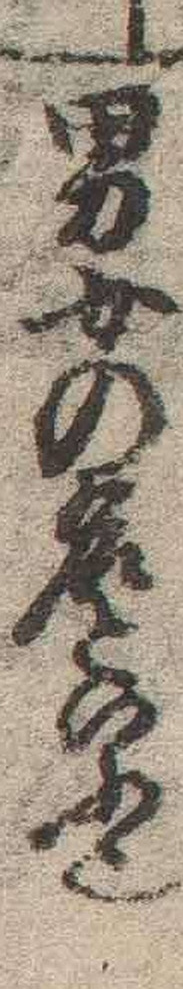号男女の名をいふ也
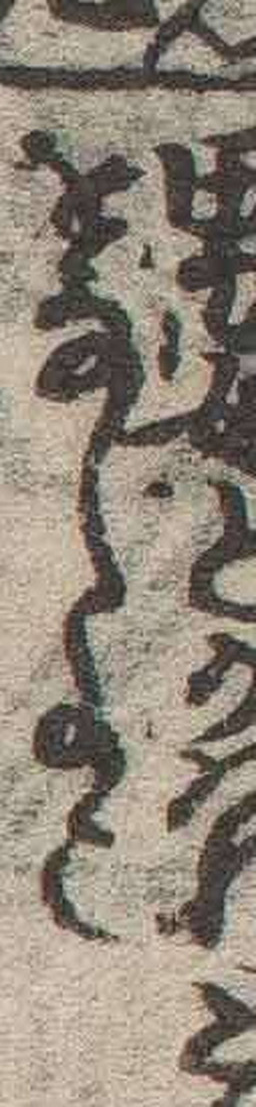をなし事也
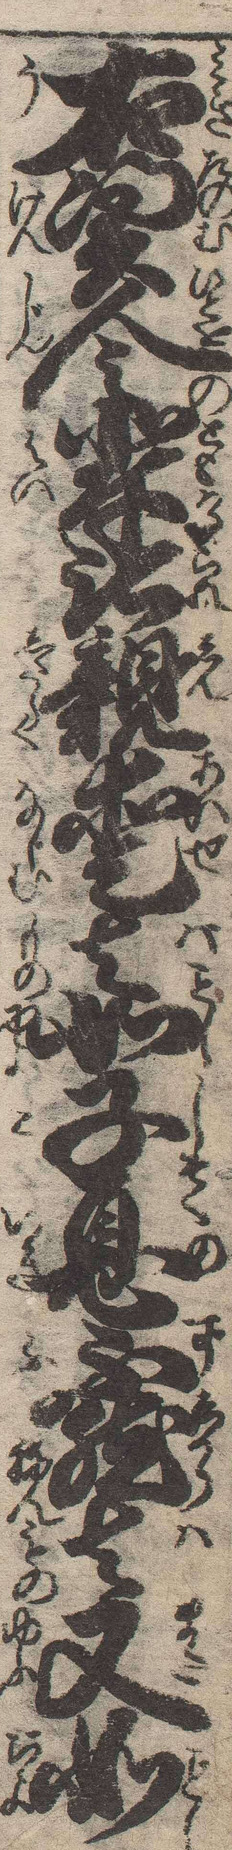右資人之輩被親愛者如子息不膳然者又如
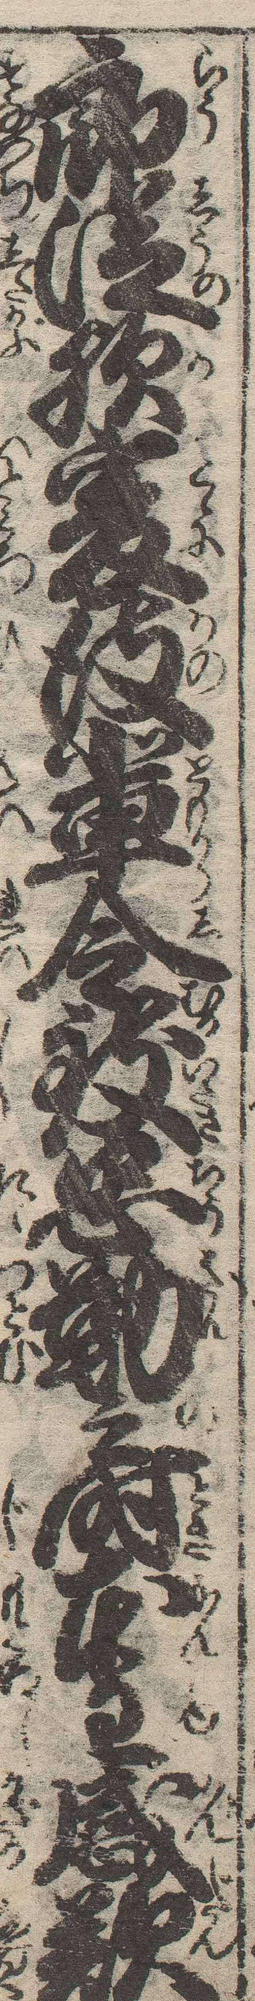郎従欤爰彼輩令致忠勤之時本主感歎
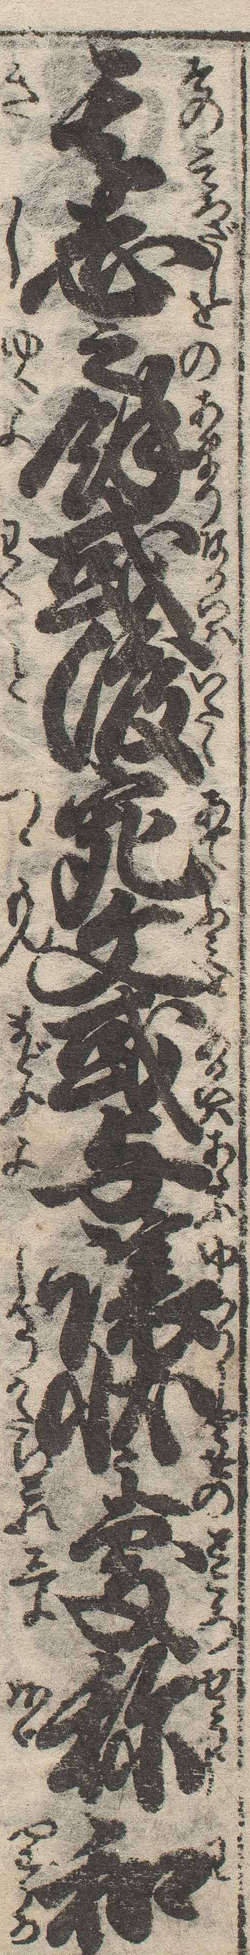其志之餘或渡宛文或与譲状之處称和
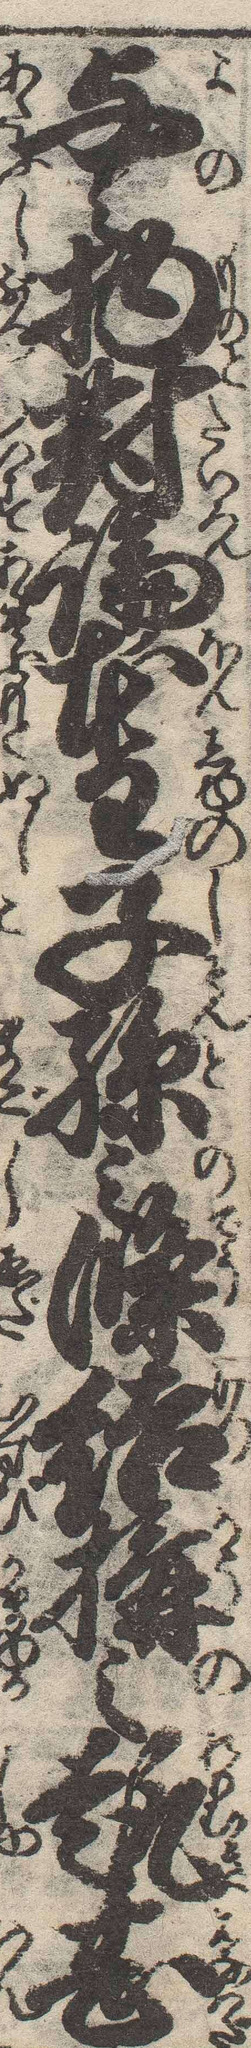与之物對論本主子孫之條結構之趣甚
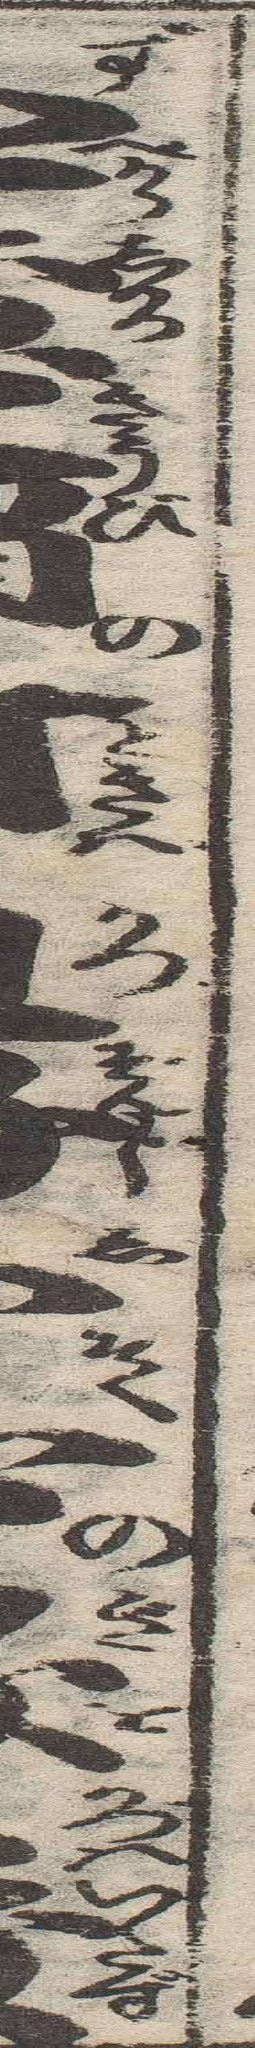ずべからしかりきうびのときはかつぞんじしそくのぎかつはいたす
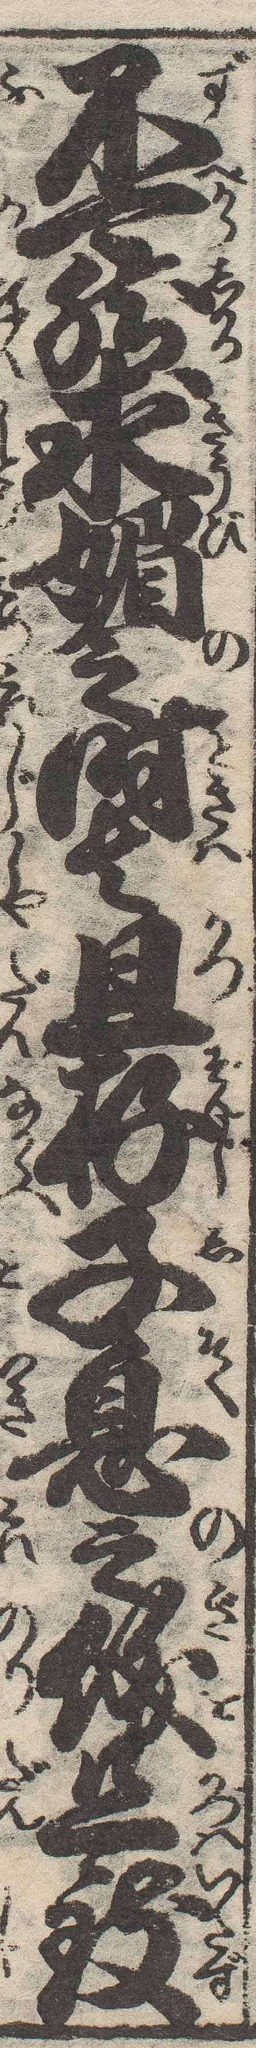不可然求媚之時者且存子息之儀且致
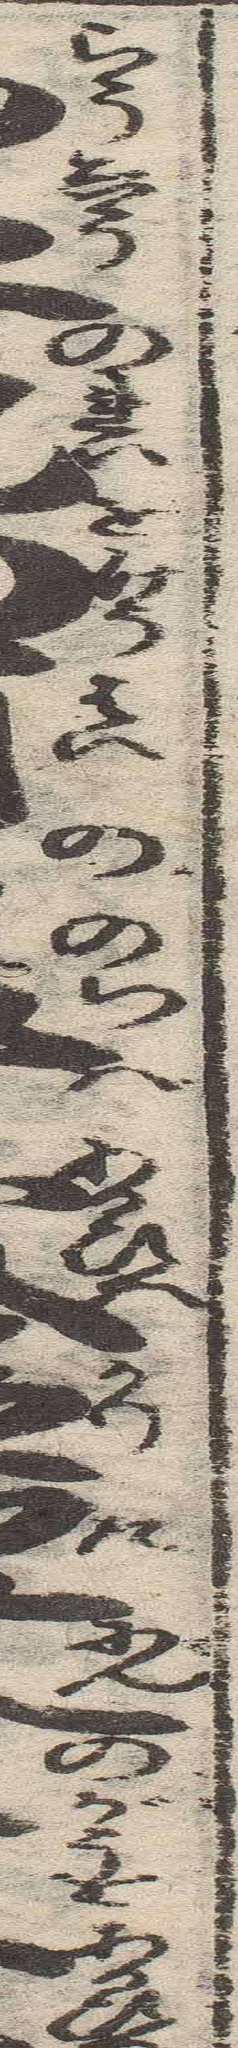らうじうのれいをけうはいののちはあるひはかりたにんのがうをあるひは
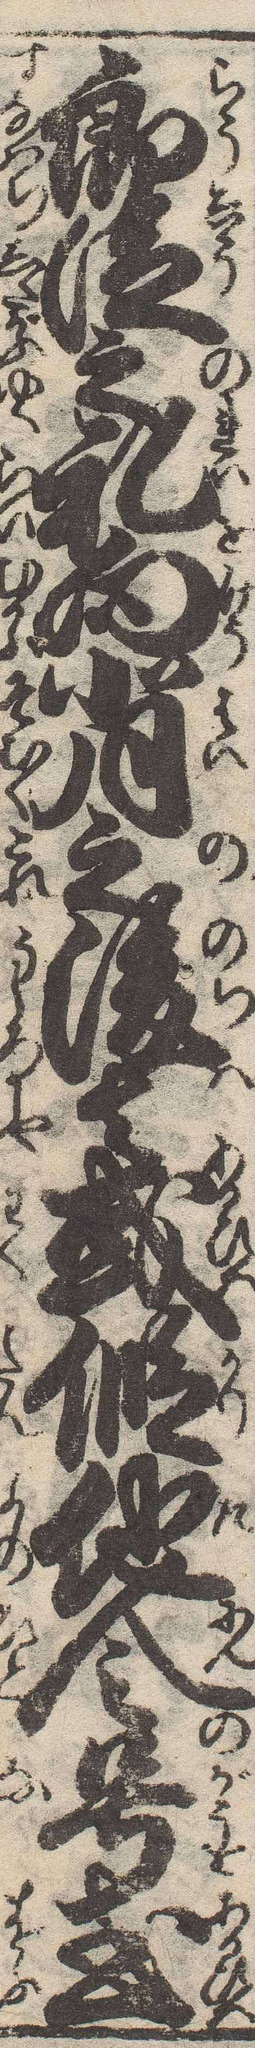郎従之礼向背之後者或假他人之号或
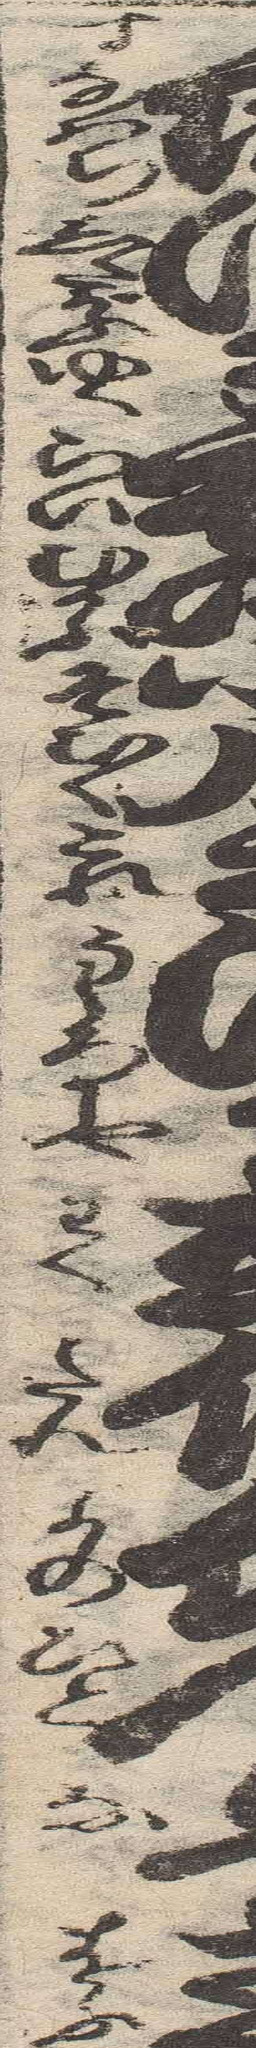すなはちしたがふゆくらいむかふそむくこれうしろしやわくたんよのひとなまどふ
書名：御成敗式目絵抄
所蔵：東京学芸大学附属図書館 国文学研究資料館
